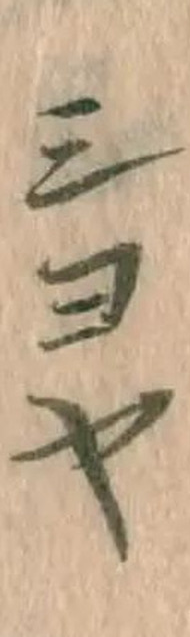シヨヤ
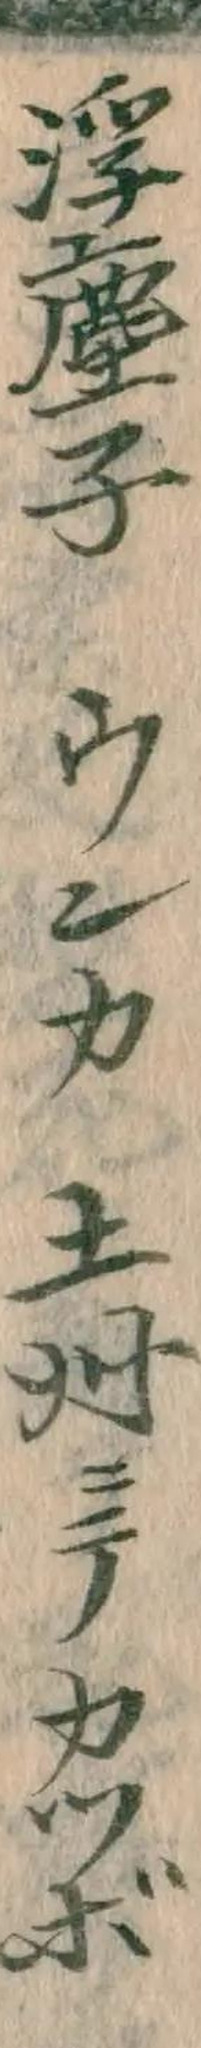浮塵子ウンカ土州ニテカツボ
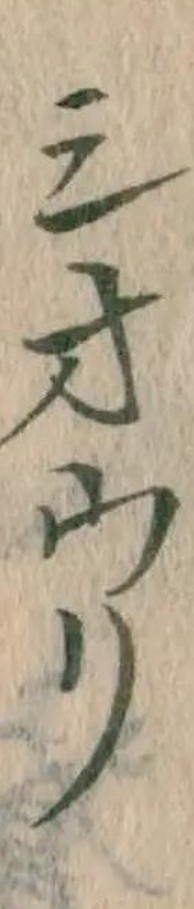シオウリ
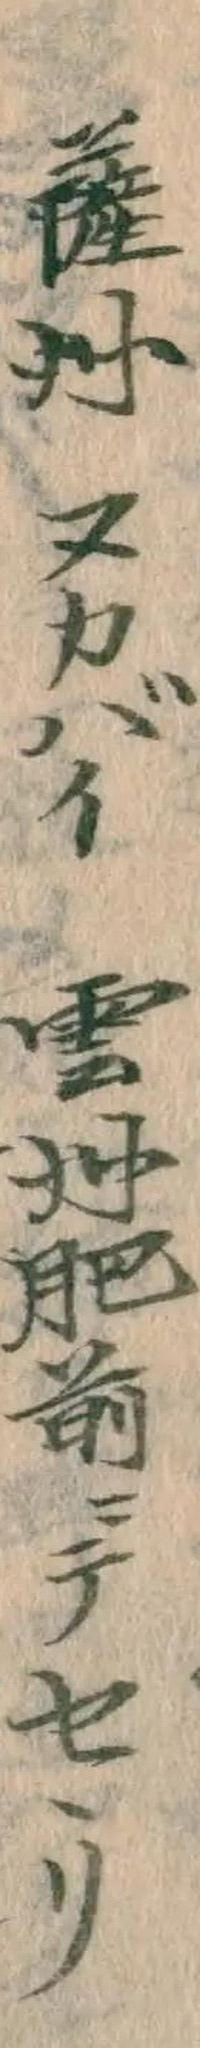薩州ヌカバイ雲州肥前ニテセヽリ
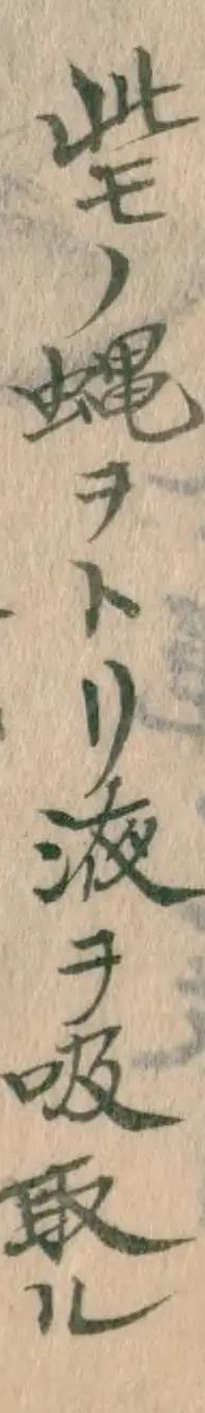此モノ蠅ヲトリ液ヲ吸取ル
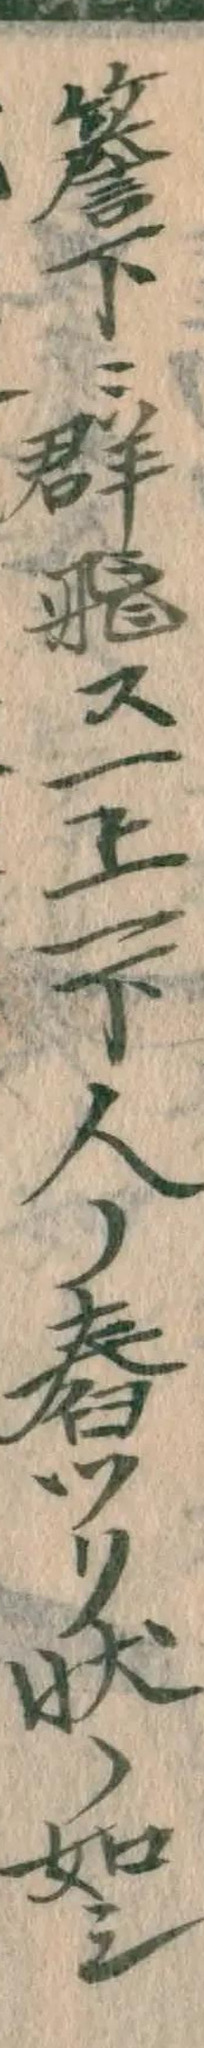簷下ニ群飛ス一上一下人ノ舂ツク状ノ如シ
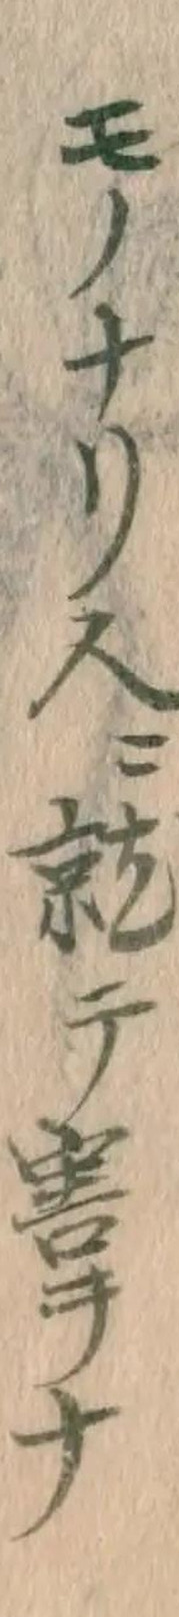モノナリ人ニ就テ害ヲナ
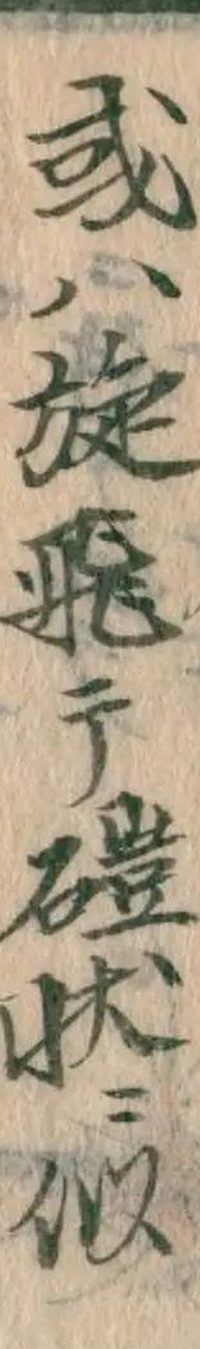或ハ旋飛テ磑状ニ似
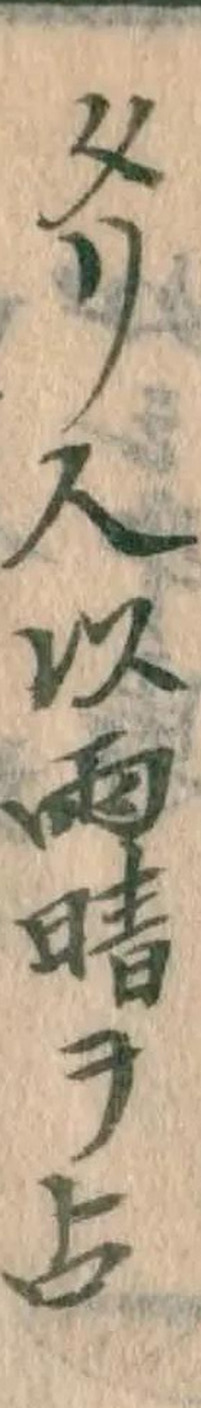タリ人以雨晴ヲ占
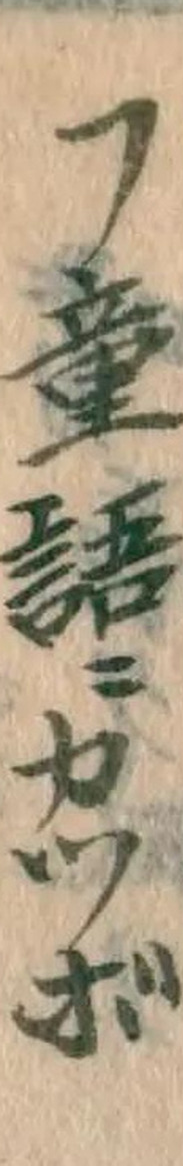フ童語ニカツボ
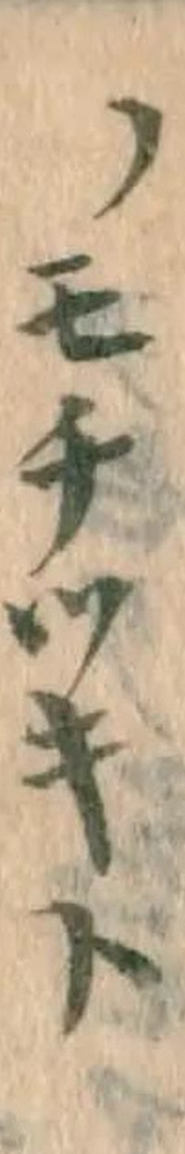ノモチツキト
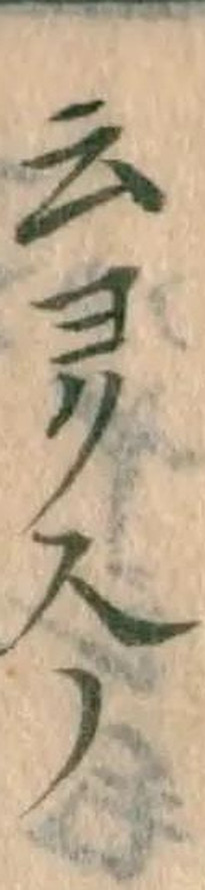云ヨク人ノ
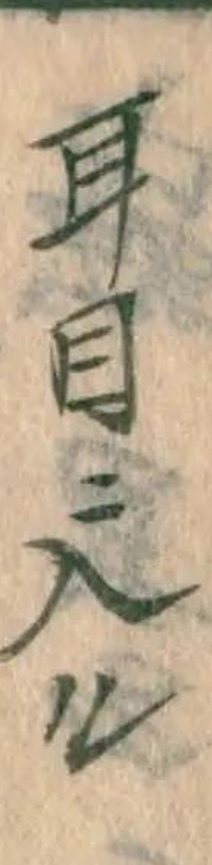耳目ニ入ル
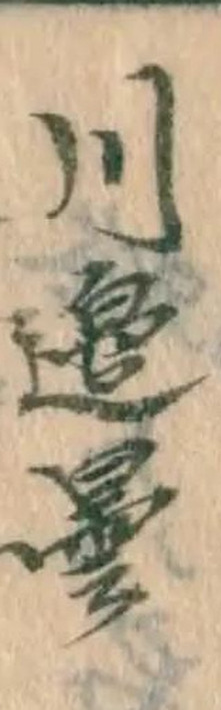川辺曇
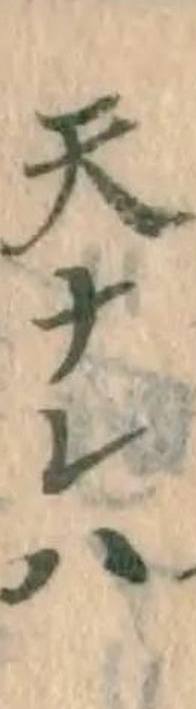天ナレハ
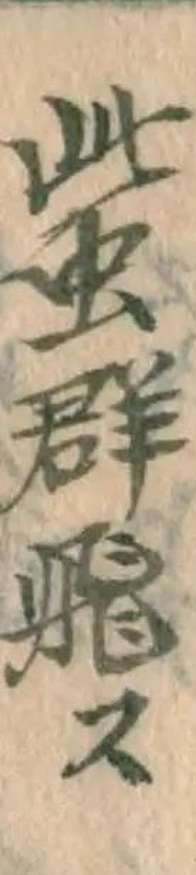此虫群飛ス
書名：千蟲譜 3巻. [3]
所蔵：国立国会図書館 National Diet Library, JAPAN
